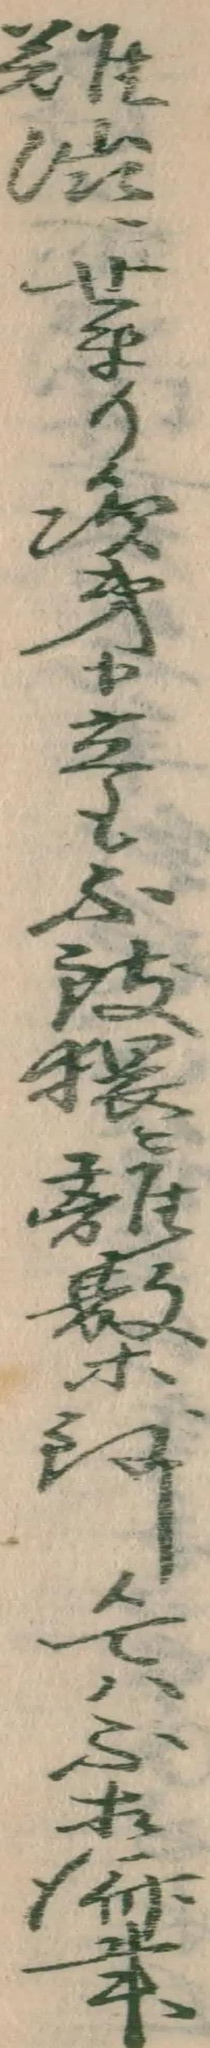難渋二せまり次第申立も不致猥二離散等致し候ては不相済事
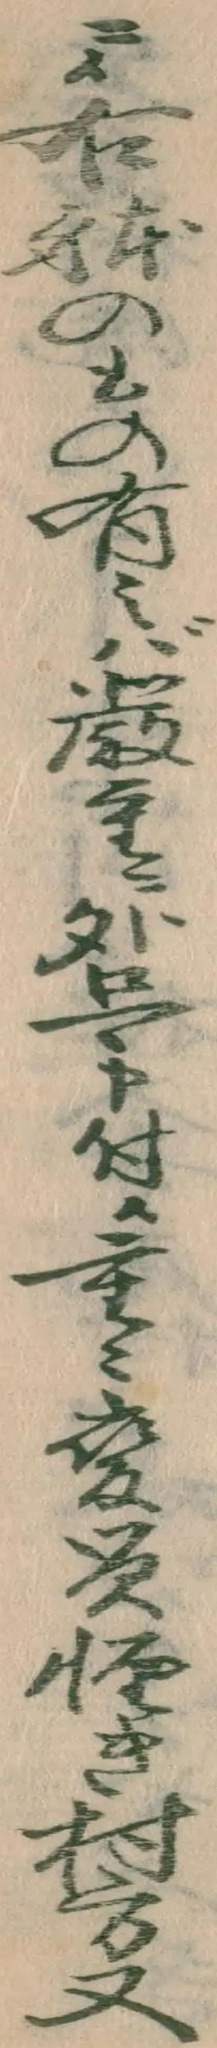二候右体のもの有之ば厳重二咎可申付候重々変災軽き村方又
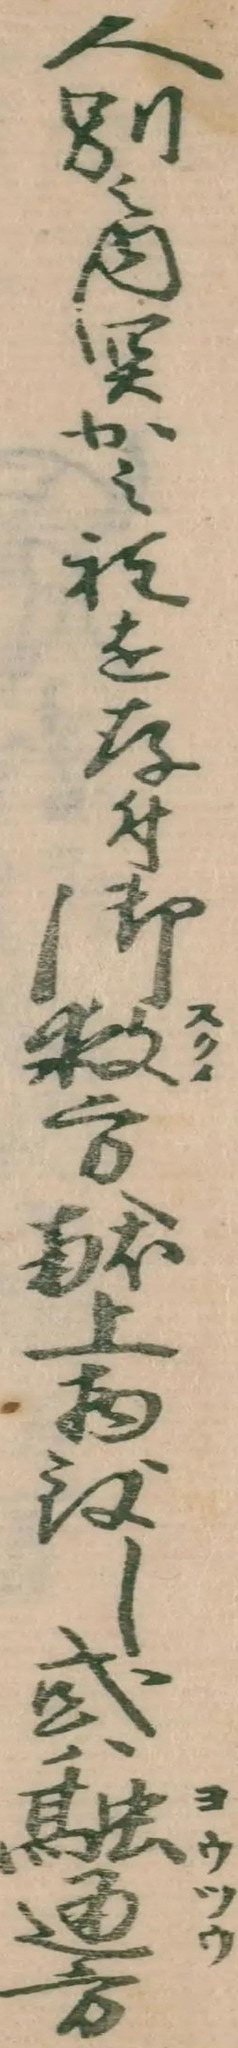人別之内災か之程を存付御救方へ献上物致し或は融通方
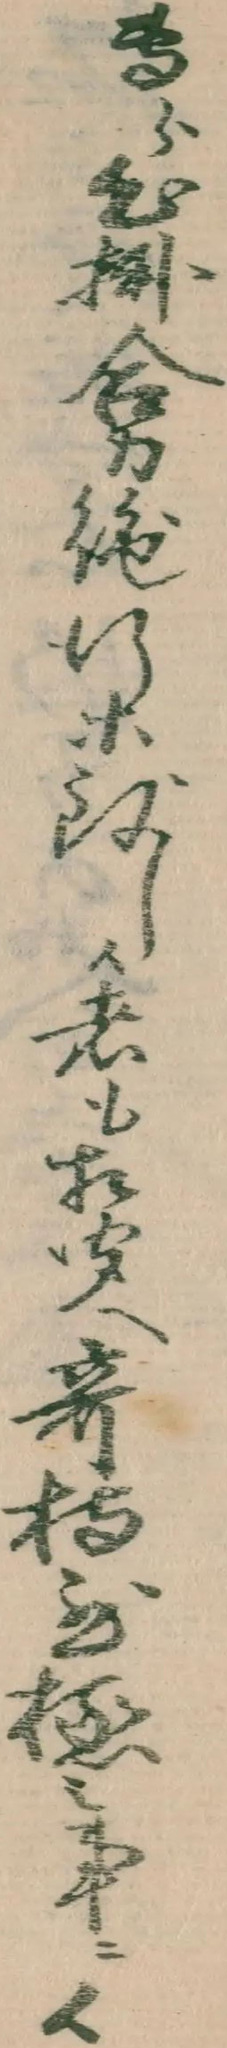等分心掛合力施行等致し候者も相聞へ奇特至極之事二候
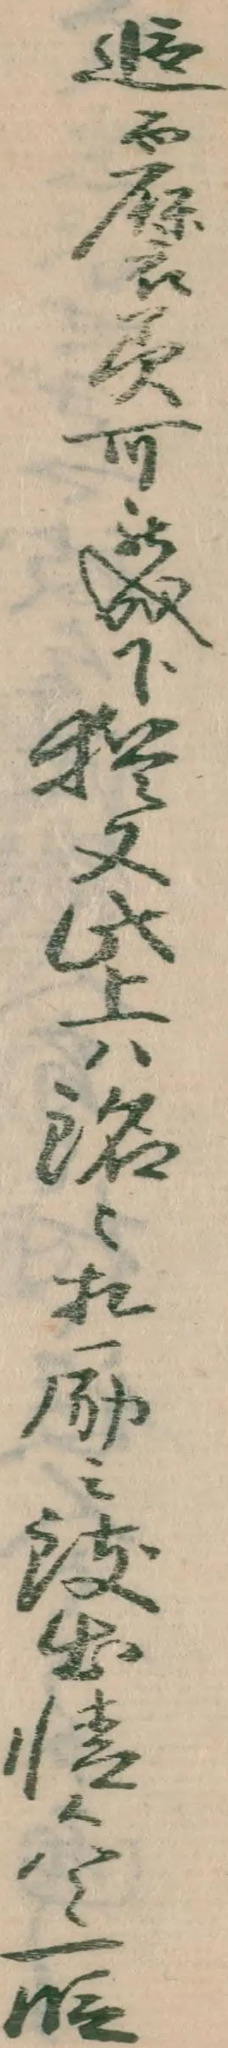追而褒美可被成下猶又此上は銘々相励み致出情候ハゝ一段
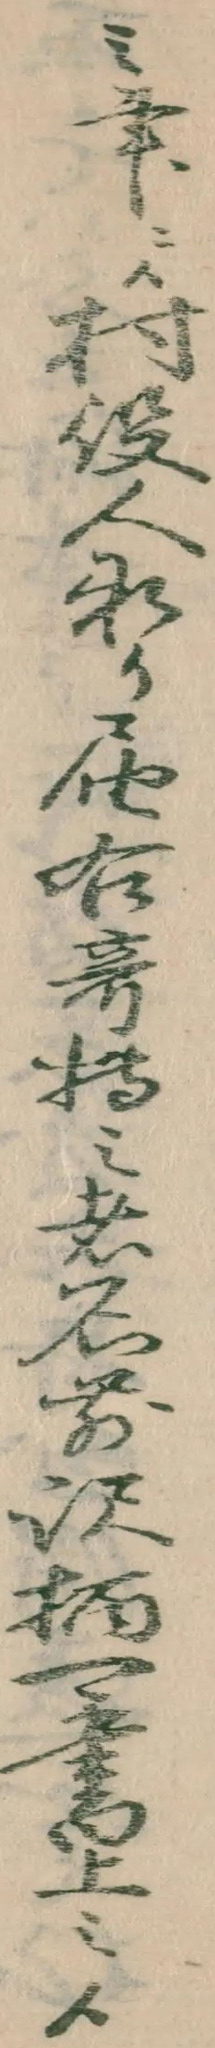之事二候村役人承り届右奇特之者名前訳柄可書上之候
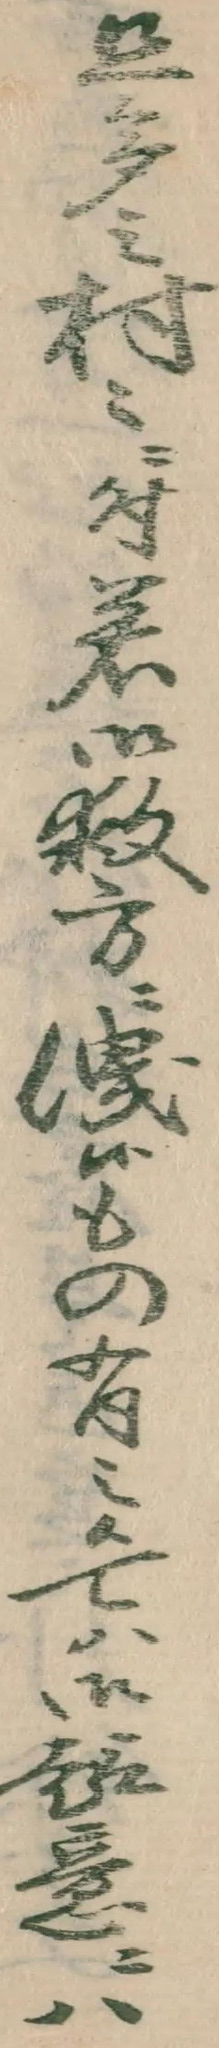且多之村々二付若御救方二洩候もの有之候ては御趣意には
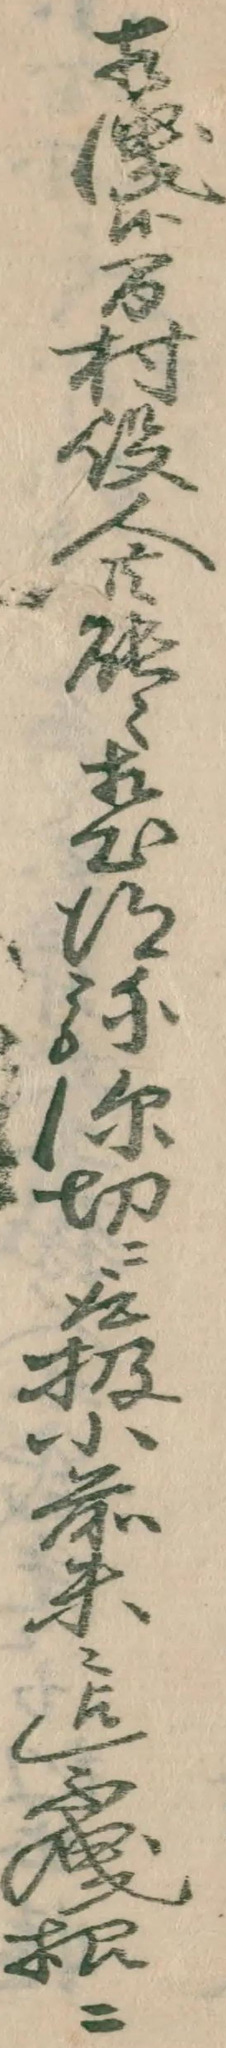相洩候間村役人共能々相心得弥親切二取扱小前末々迄不洩様二
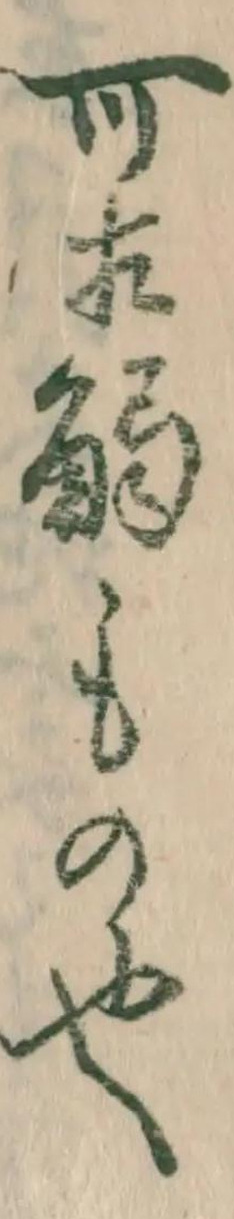可相觸候もの也
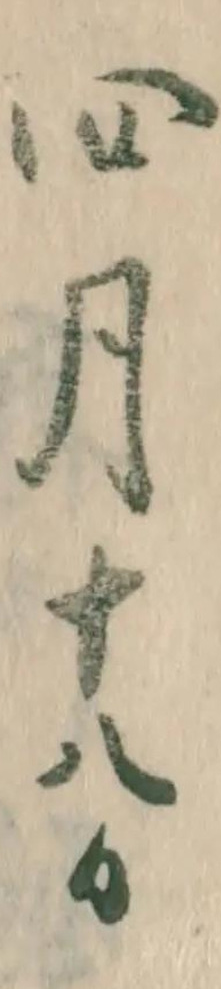四月十八日

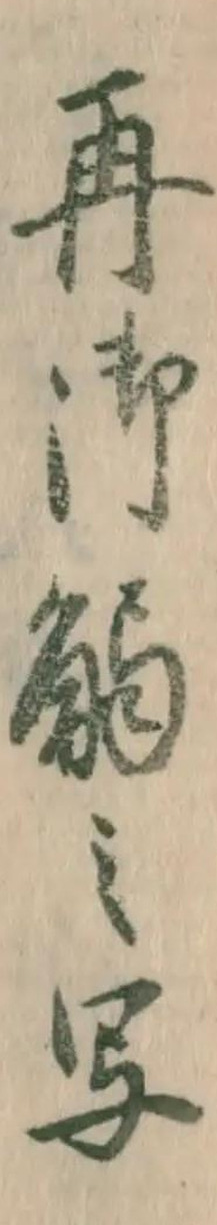再御触之写
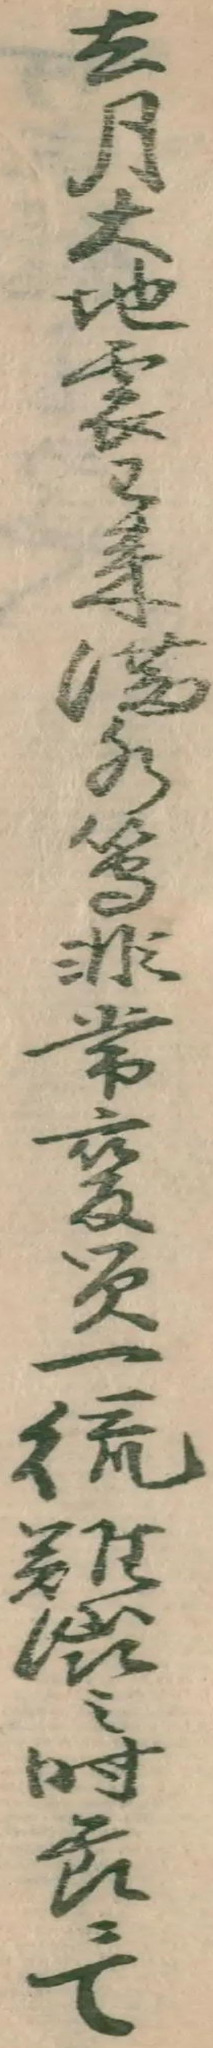去月大地震已来満水等非常変災一統難渋之時節ニて
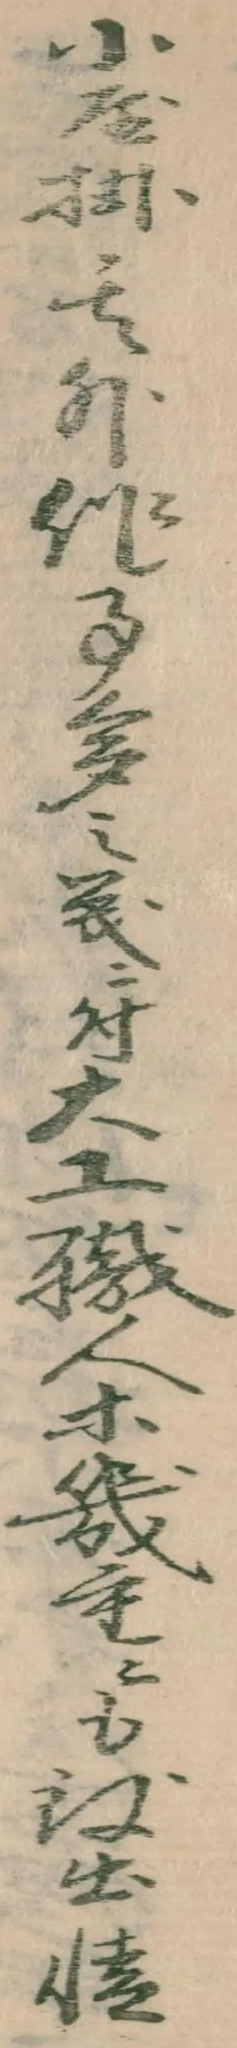小屋掛其外作事多之義ニ付大工職人等幾重ニも致出情
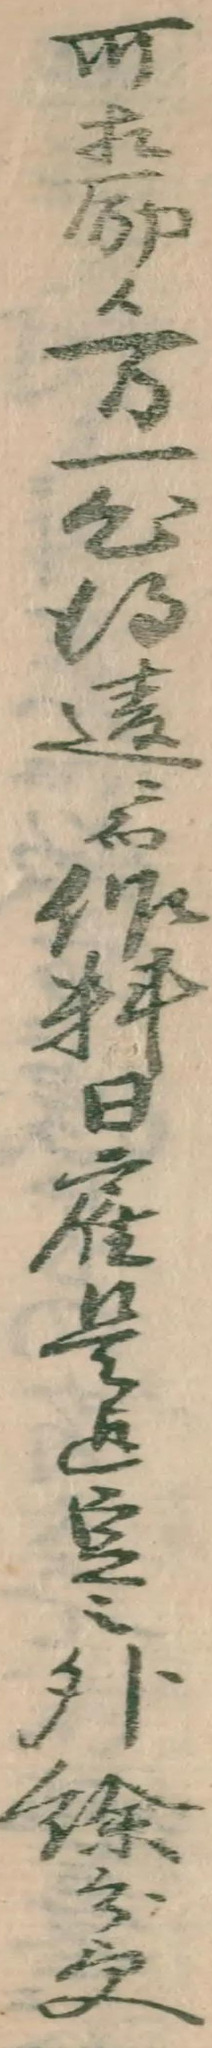所相励候万一心得違ニ而作料日雇是迄定之外余分受
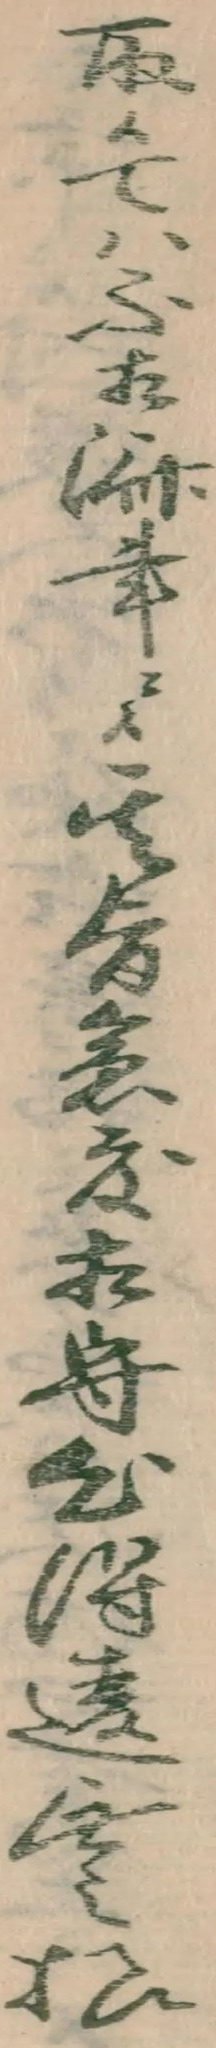取候ては不相済事ニ候其旨急度相守心得違無之様
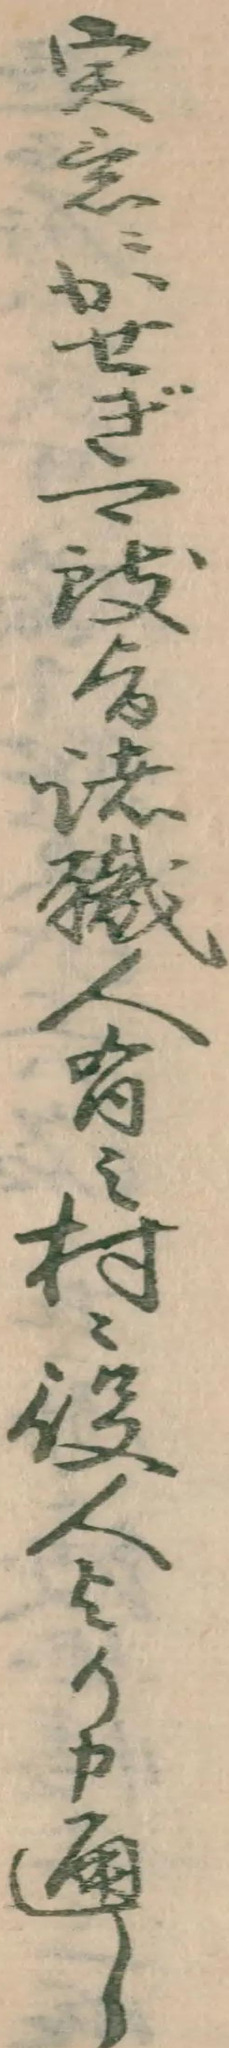実意ニかせぎ可致旨諸職人有之村々役人より申通り
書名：大地震
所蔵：国立国会図書館 National Diet Library, JAPAN
